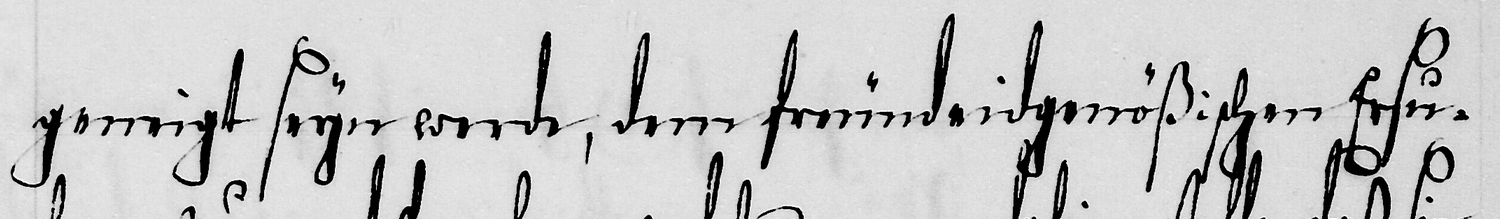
geneigt seyn werde, dem freundeidgenößischen Ersu¬
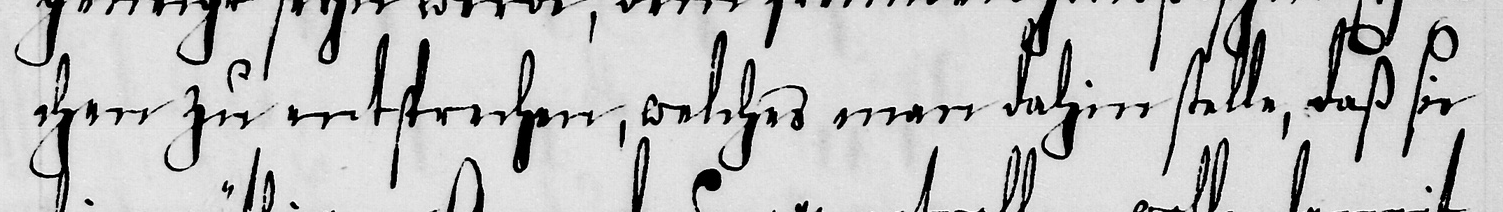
chen zu entsprechen, welches man dahin stelle, daß sie
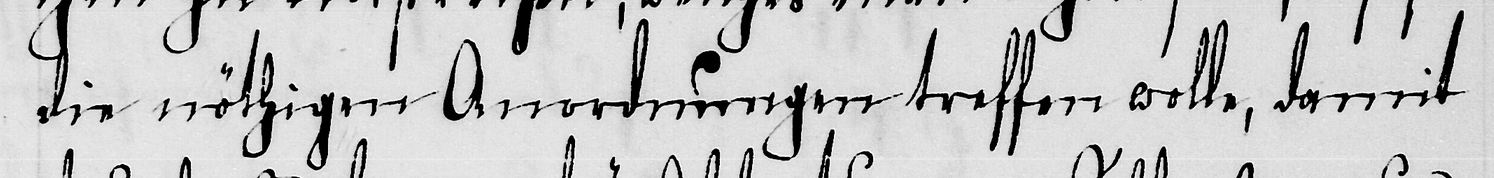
die nöthigen Anordnungen treffen wolle, damit
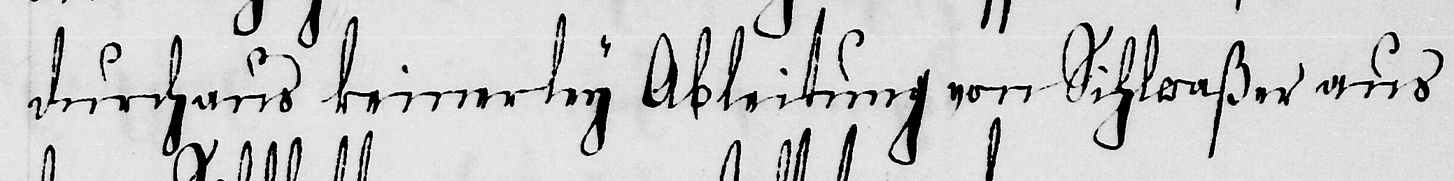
durchaus keinerley Ableitungen von Sihlwaßer aus
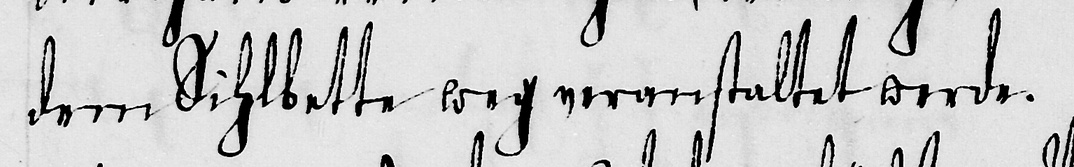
dem Sihlbette weg veranstaltet werde.
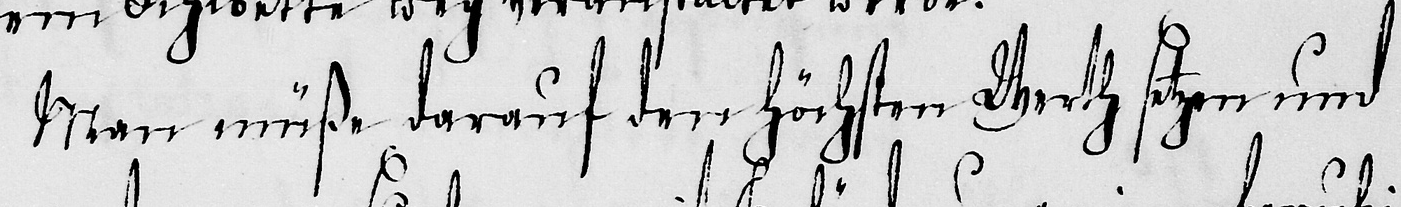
Man müße darauf den höchsten Werth setzen und
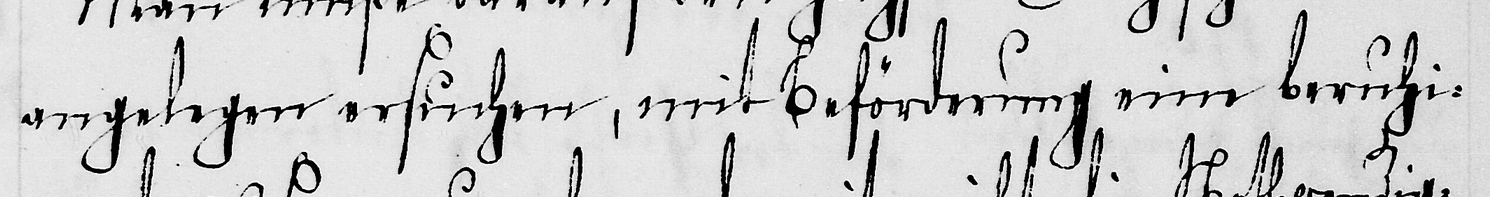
angelegen ersuchen, mit Beförderung eine beruhi¬
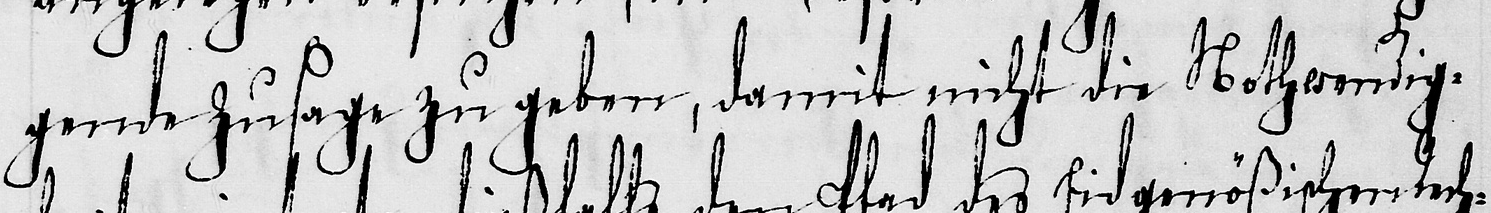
gende Zusage zu geben, damit nicht die Nothwendig¬
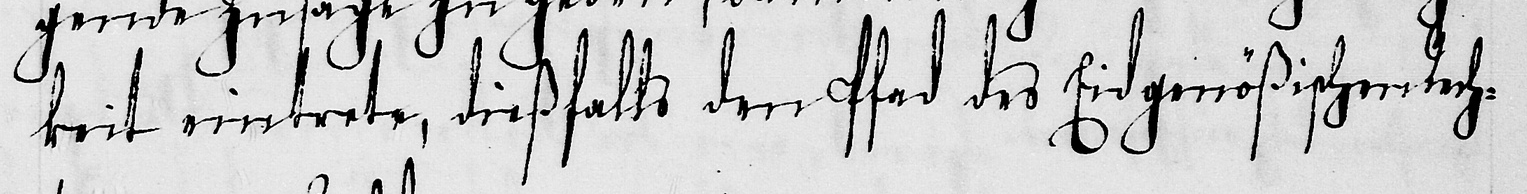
keit eintrete, dießfalls den Pfad des Eidgenößischen Rec¬
